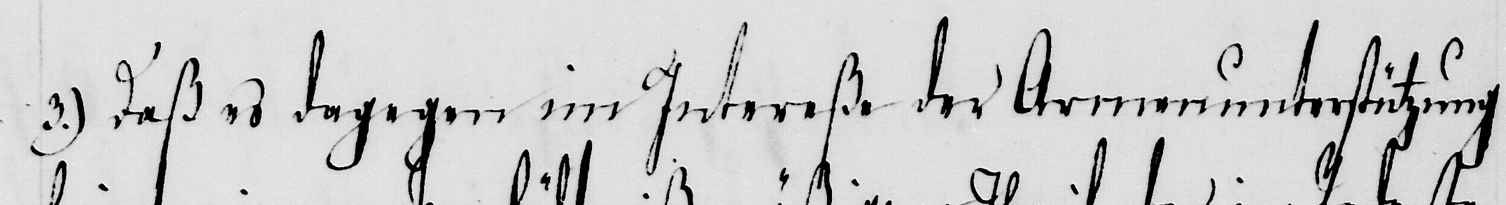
3.) Daß es dagegen im Intereße der Armenunterstützung
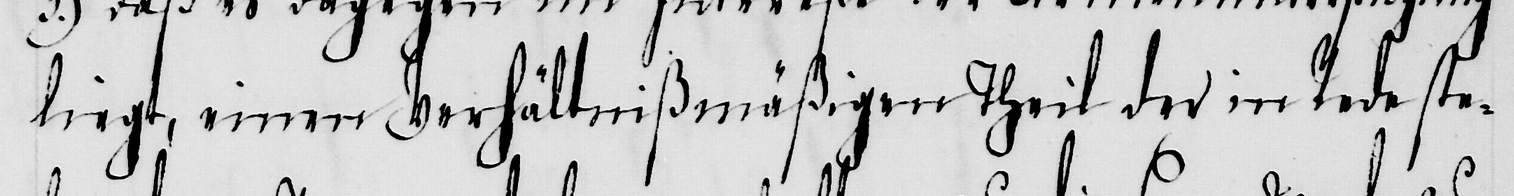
liegt, einen Verhältnißmäßigen Theil der in Rede ste¬
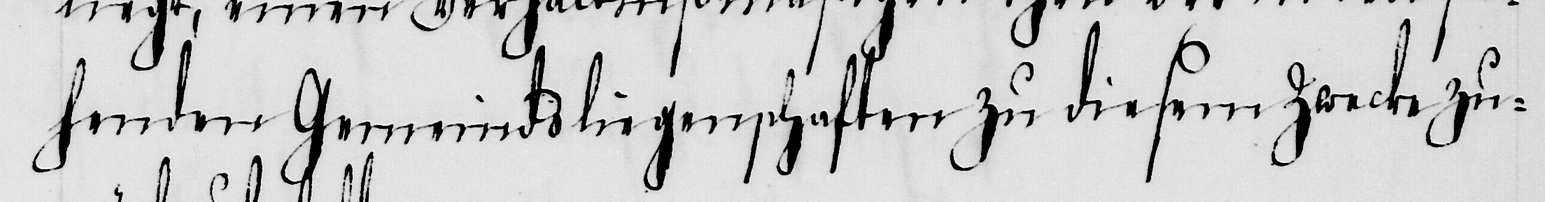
henden Gemeindsliegenschaften zu diesem Zwecke zu¬
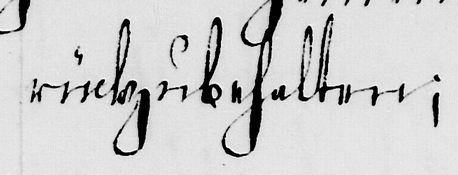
rückzubehalten;
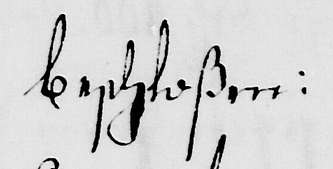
beschloßen:
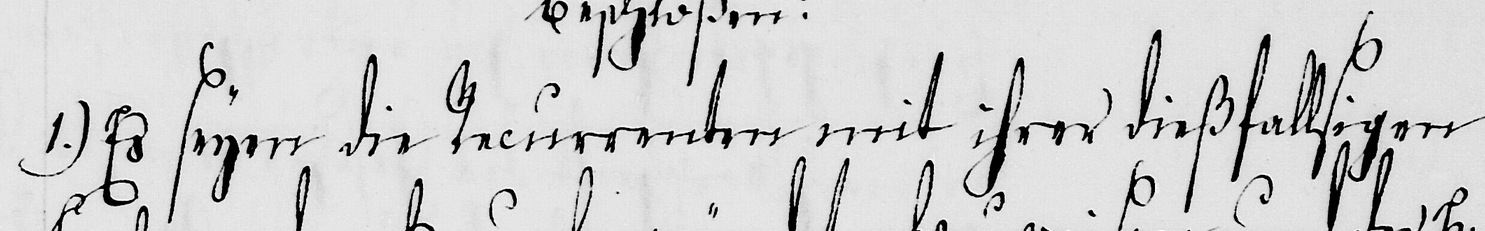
1.) Es seyen die Recurrenten mit ihrer dießfallsigen
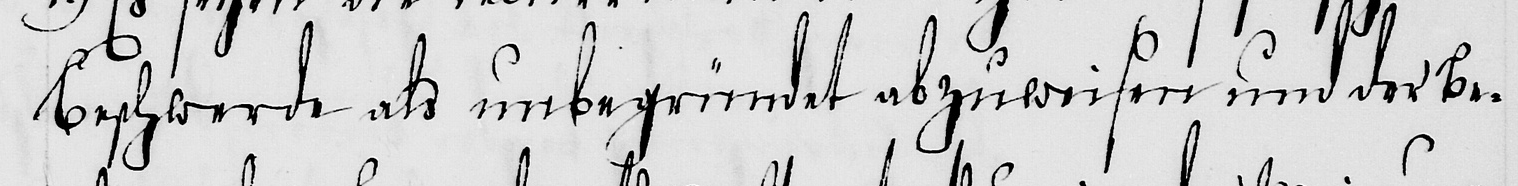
Beschwerde als unbegründet abzuweisen und der Be¬
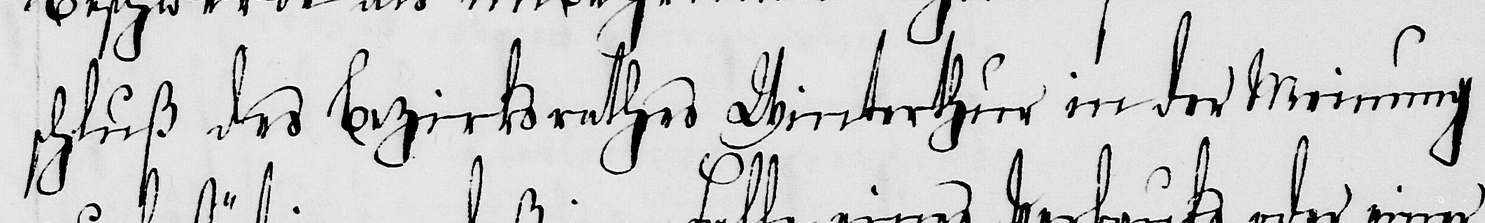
schluß des Bezirksrathes Winterthur in der Meinung
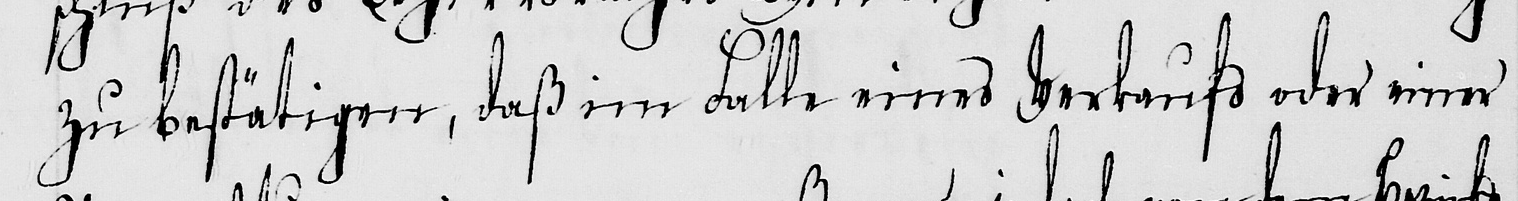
zu bestätigen, daß im Falle eines Verkaufs oder einer
